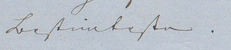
Bestimteste.
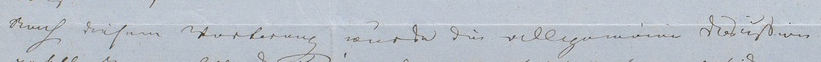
Nach diesem Vortrag wurde die allgemeine Discussion
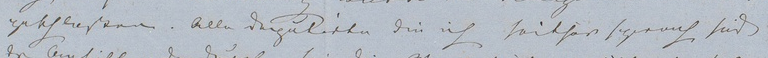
geschloßen. Alle Deputirten die ich seither sprach sind
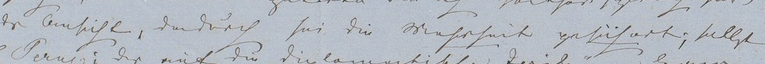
der Ansicht, dadurch sei die Mehrheitgesichert; selbst
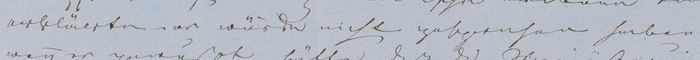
erklärte – er würde nicht gesprochen haben
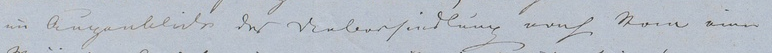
im Augenblik der Uebersiedlung nach Rom eine
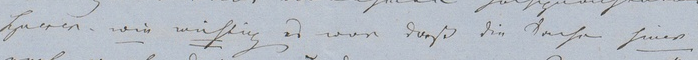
Herr – wiewichtig es war daß die Sache hier
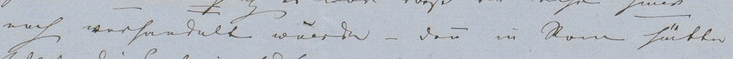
noch verhandelt wurde – denn in Rom hätte
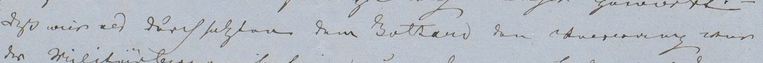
Daß wir es durchsetzten dem Gothard den Vorrang vor
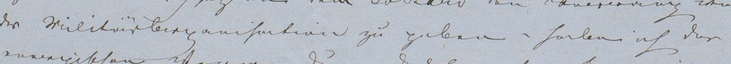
der MilitärOrganisation zu geben – habe ich der
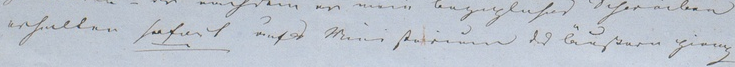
erhalten sofort aufs Ministerium des Äußern gieng
